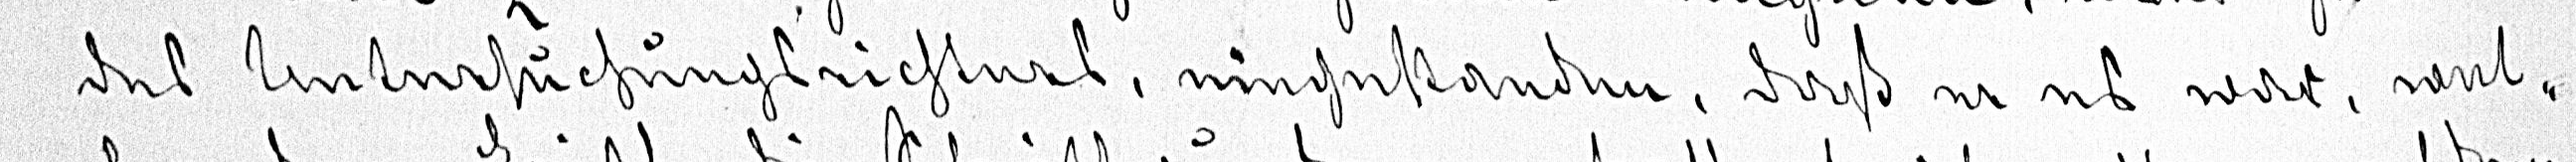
des Untersuchungsrichters, eingestanden, daß er es war, wel¬
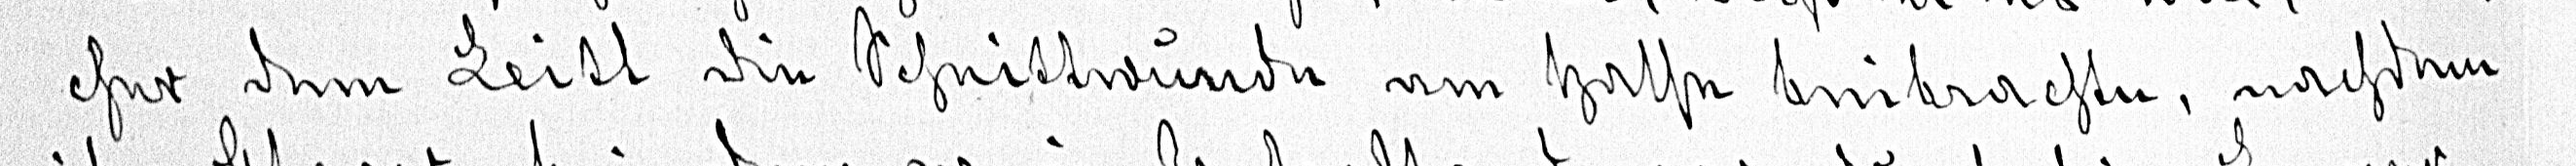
cher dem Leitl die Schnittwunde am Hasse beitrachte, nachdem
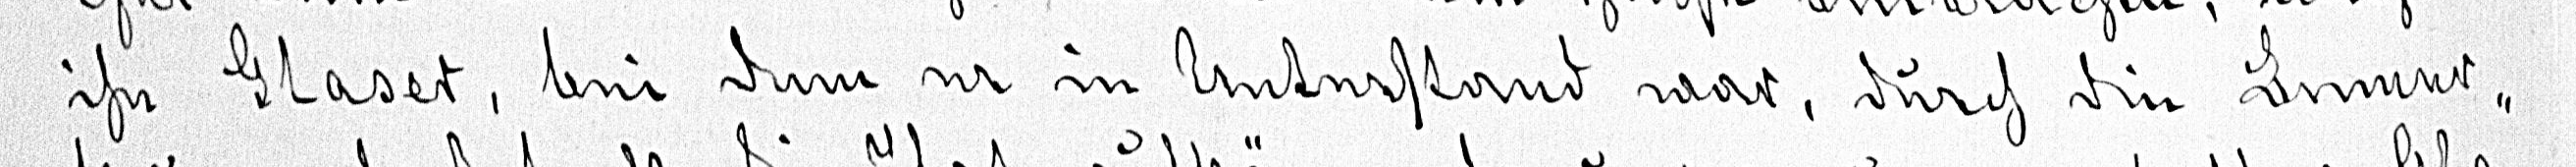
ihn Glaser, bei dem er in Unterstand war, durch die Bemer¬
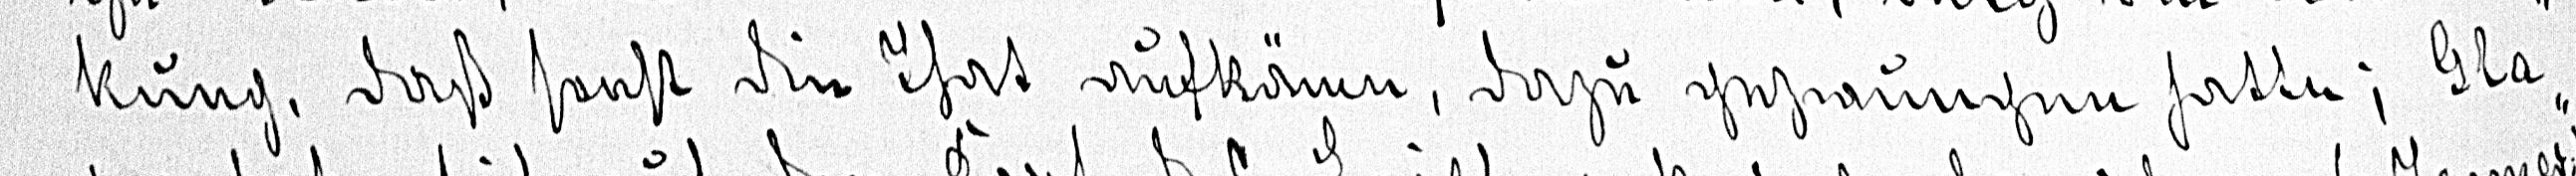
kung, daß sonst die That aufkäme, dazu gezwungen hatte; Gla¬
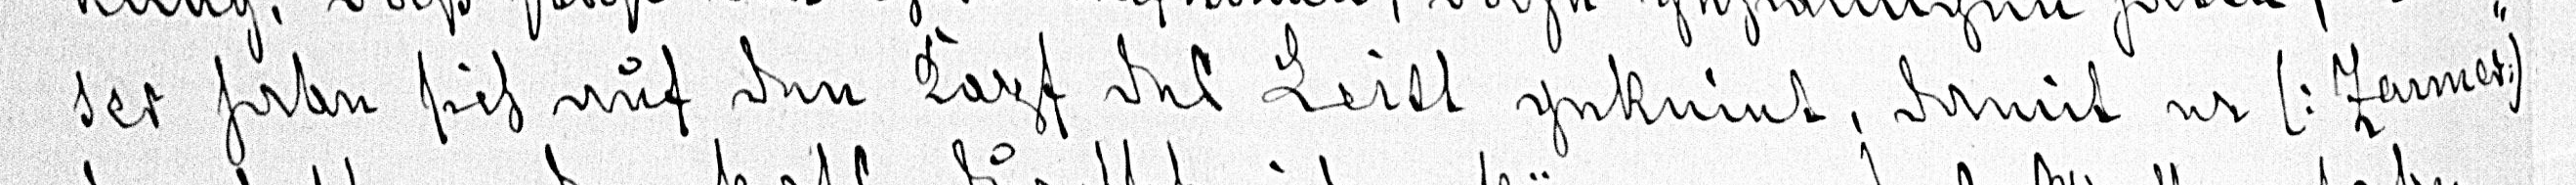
ser habe sich auf den Kopf des Leitl gekniet, damit er (: Zauner:)
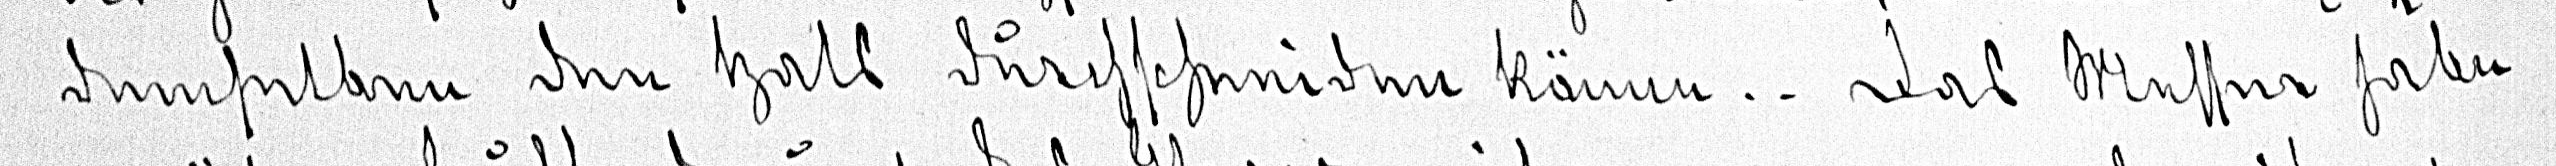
demselben den Hals durchschneiden könne. - Das Messer habe
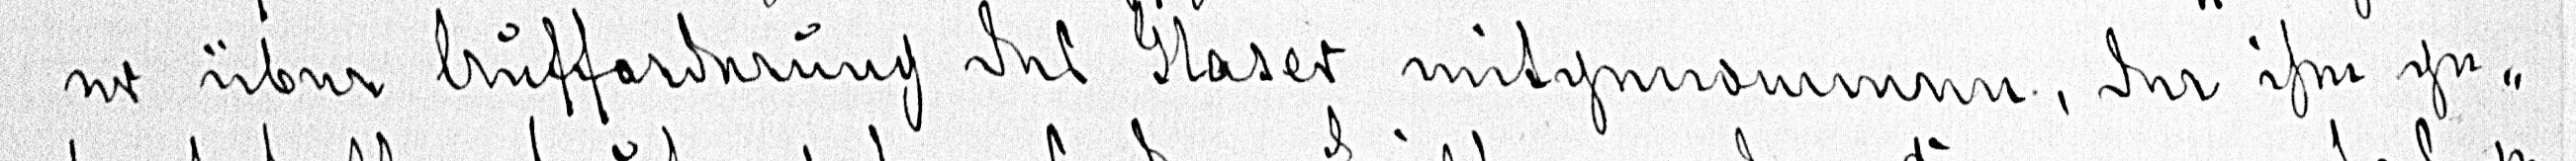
er über Aufforderung des Glaser mitgenommen, der ihm ge¬
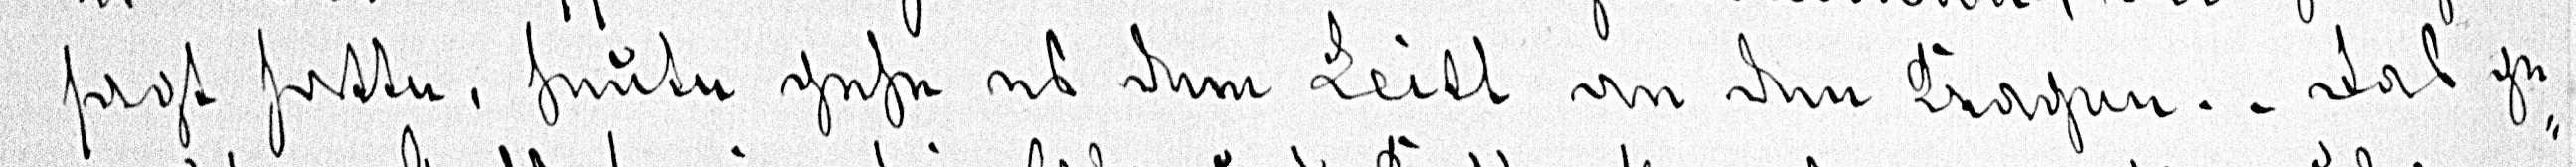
sagt hatte, heute gehe es dem Leitl an den Kragen. - Das ge¬
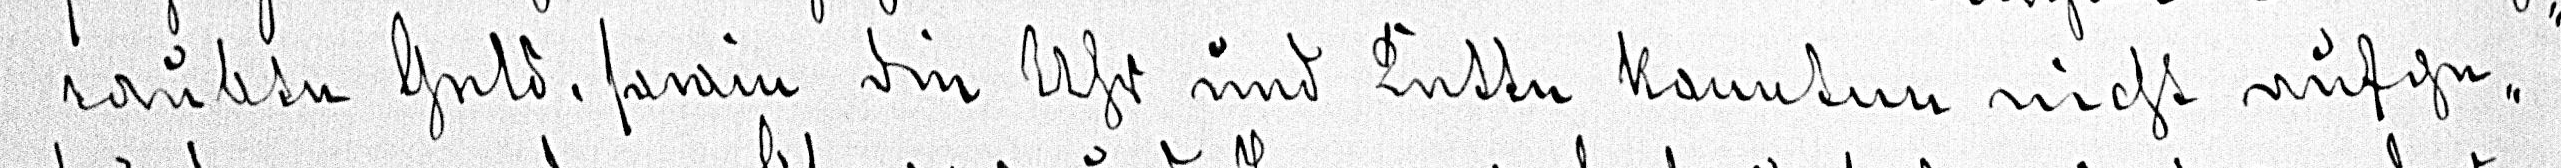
raubte Geld. sowie die Uhr und Kette konnten nicht aufge¬
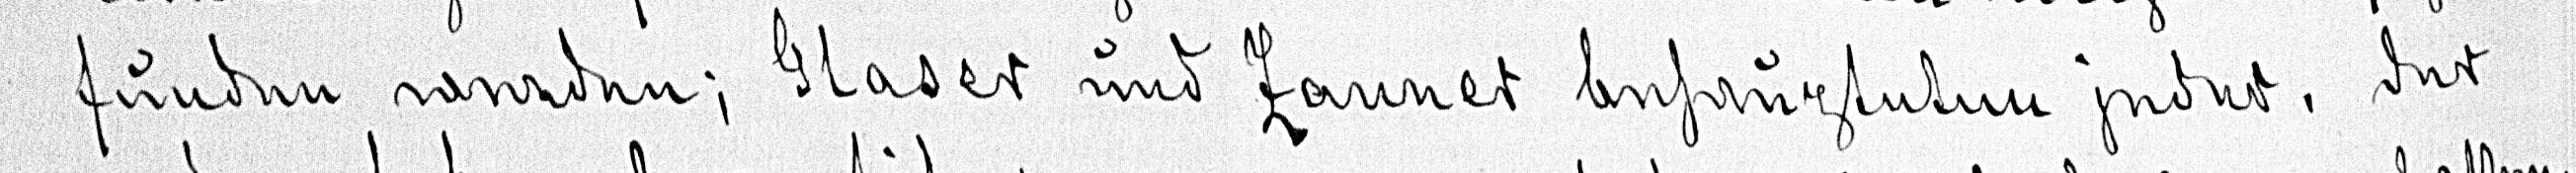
funden werden; Glaser und Zauner behaupteten jeder, der
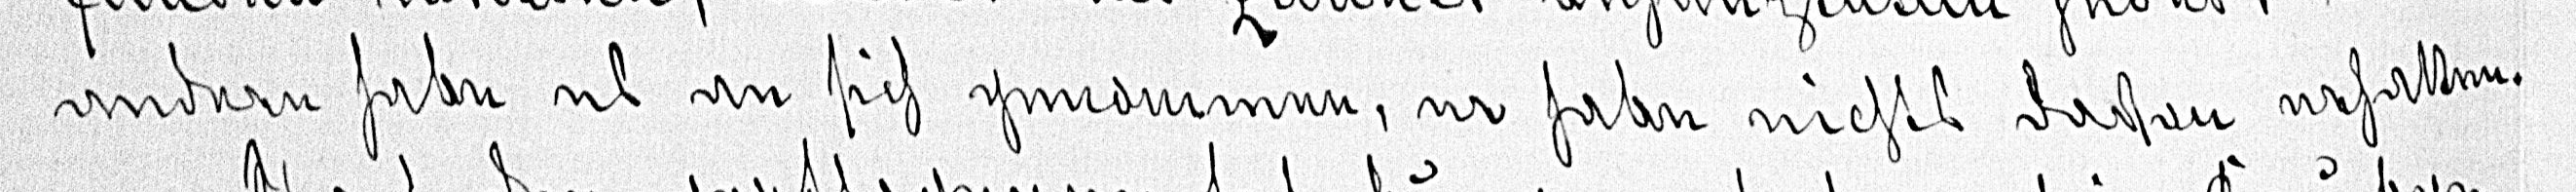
andern habe es an sich genommen, er habe nichts davon erhalten.
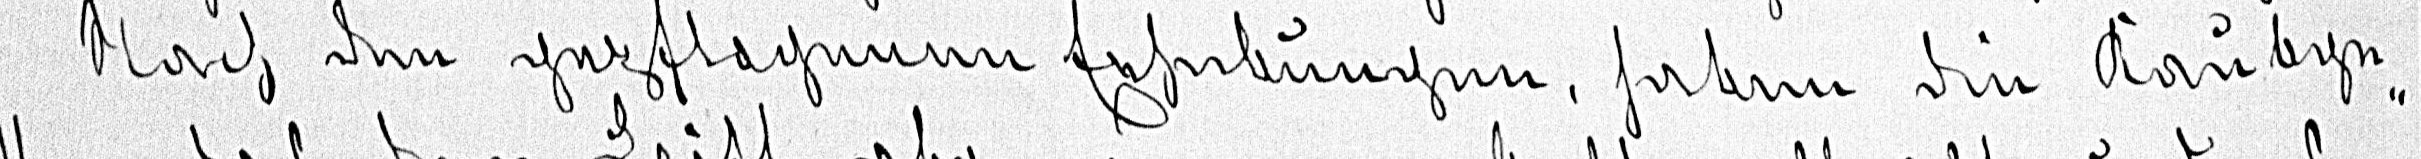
Nach den gepflogenen Erhebungen, haben die Raubge¬
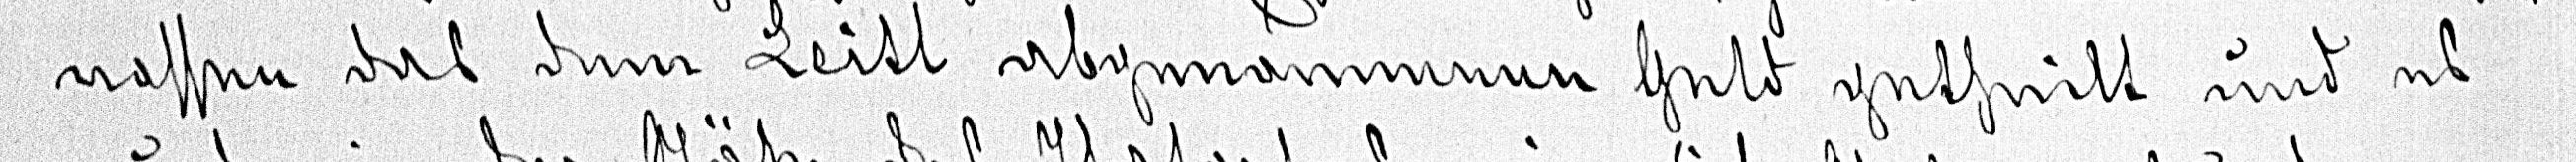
nossen das dem Leitl abgenommene Geld getheilt und es
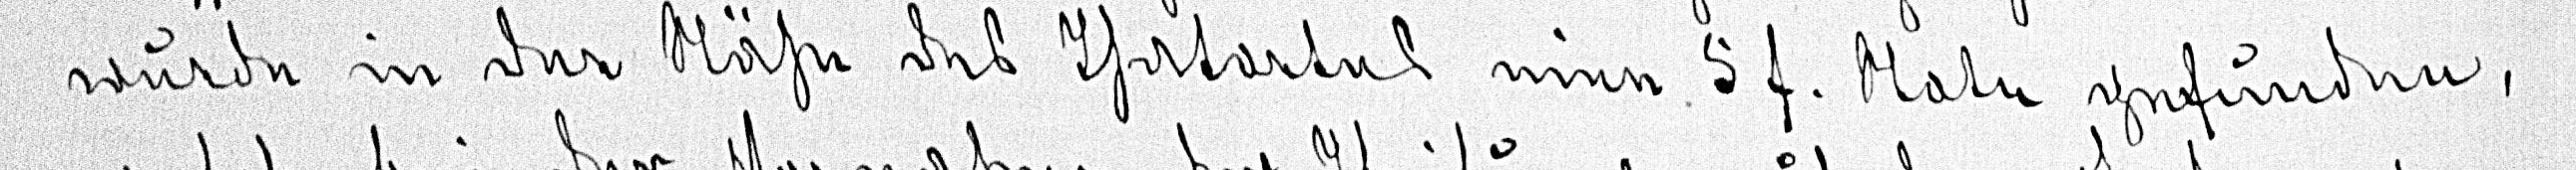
wurde in der Nähe des Thatortes eine 5 f. Nate gefunden,
